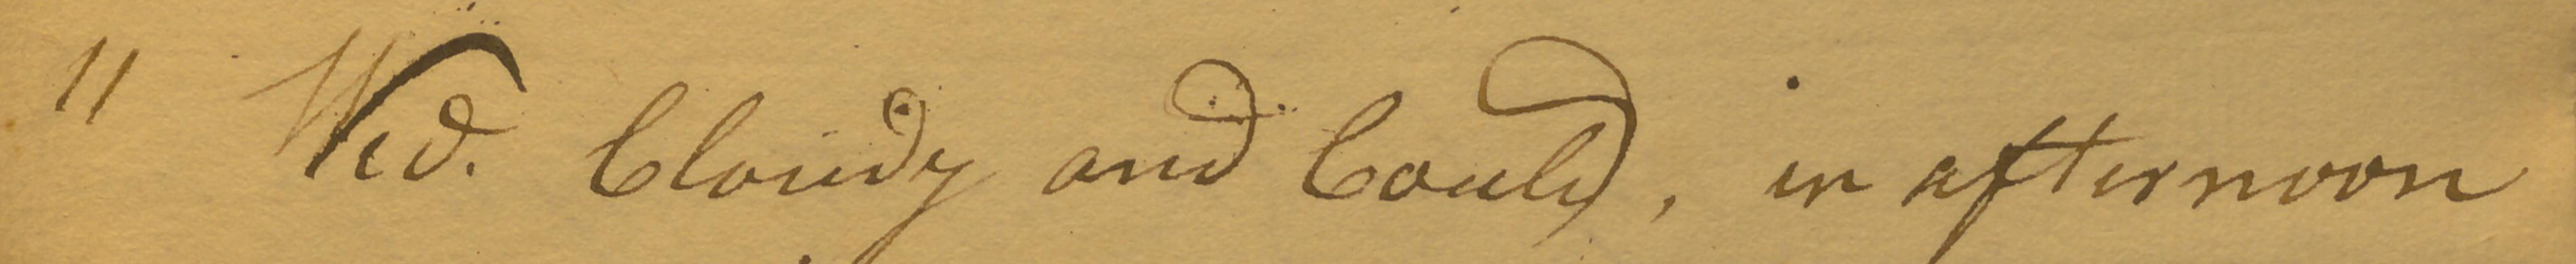11 Wed. Cloudy and Could, in afternoon
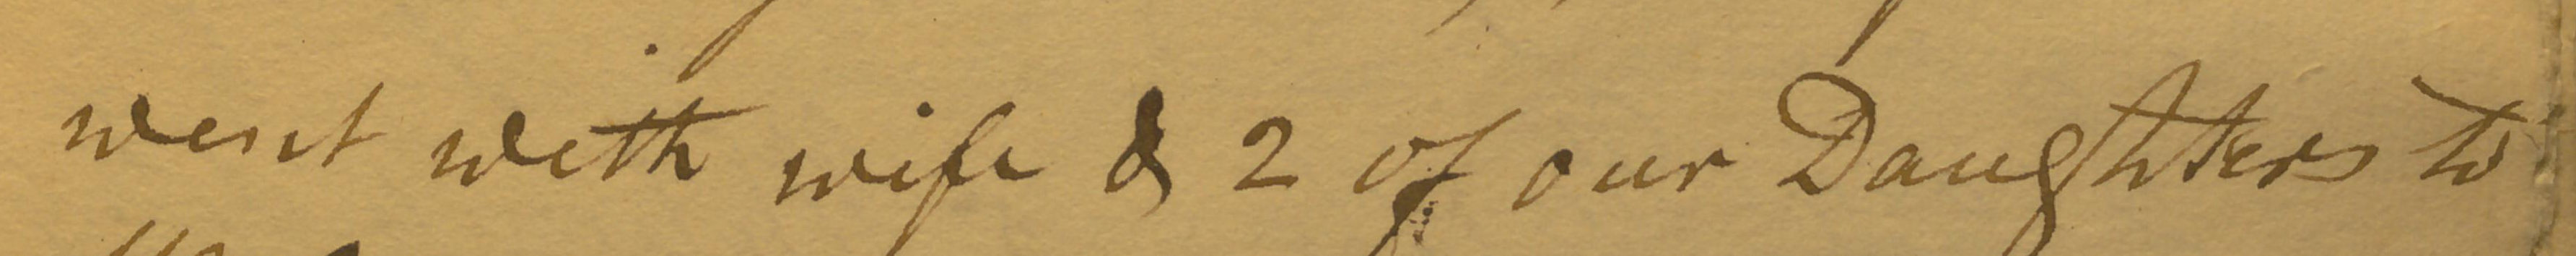went with wife & 2 of our Daughters to
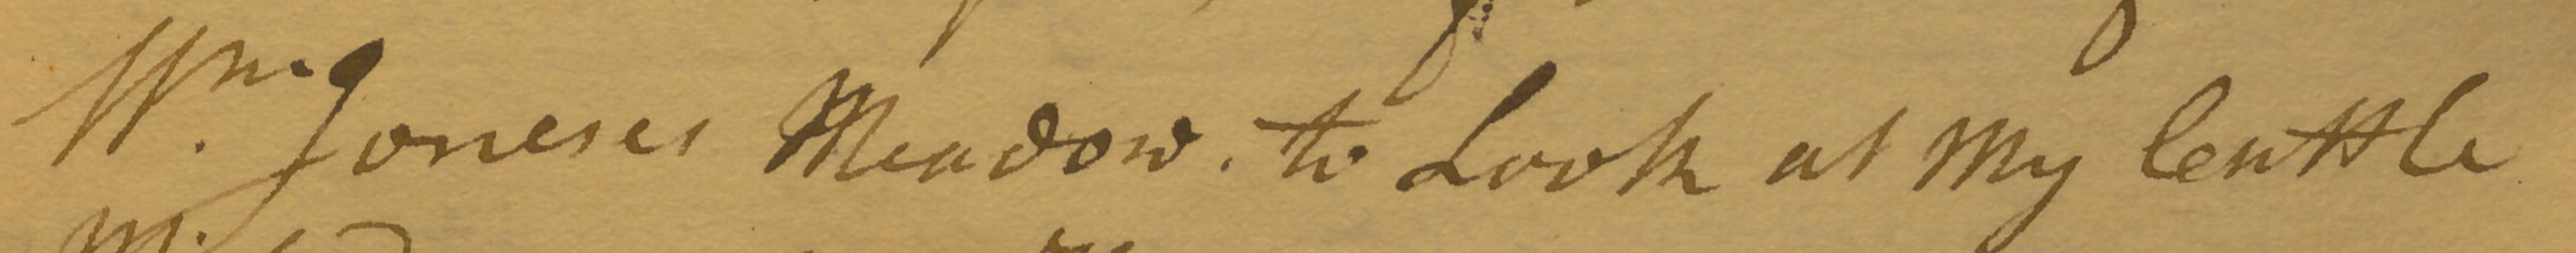W^m. Joneses Meadow. to Look at My Cattle
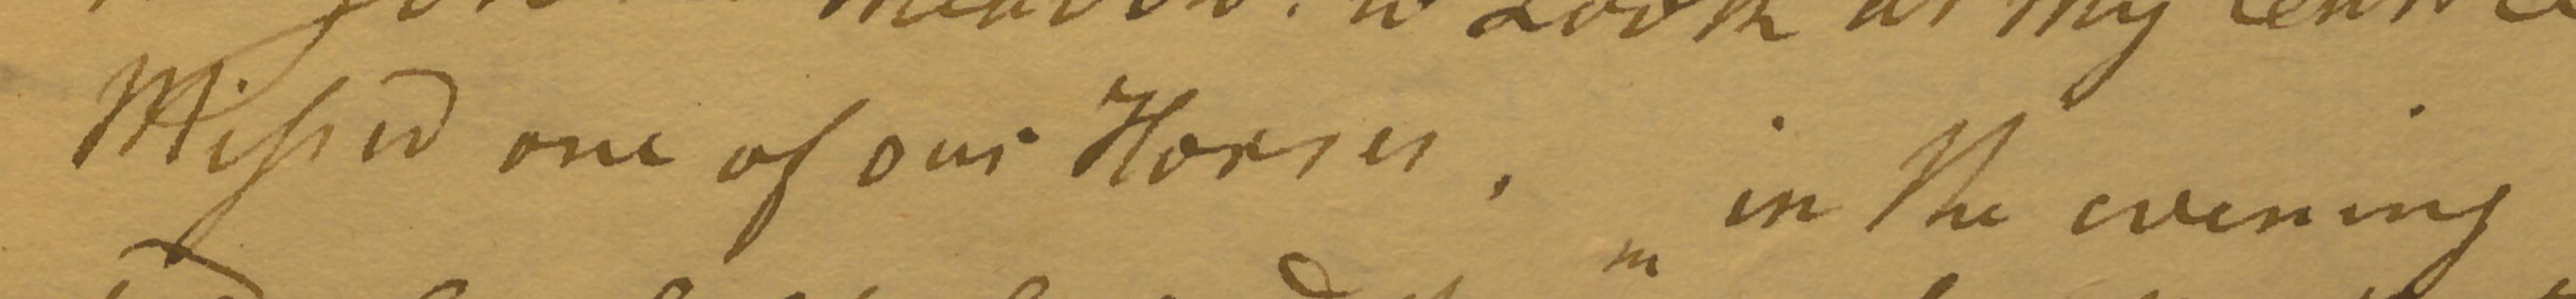Missed one of our Horses, in the evening
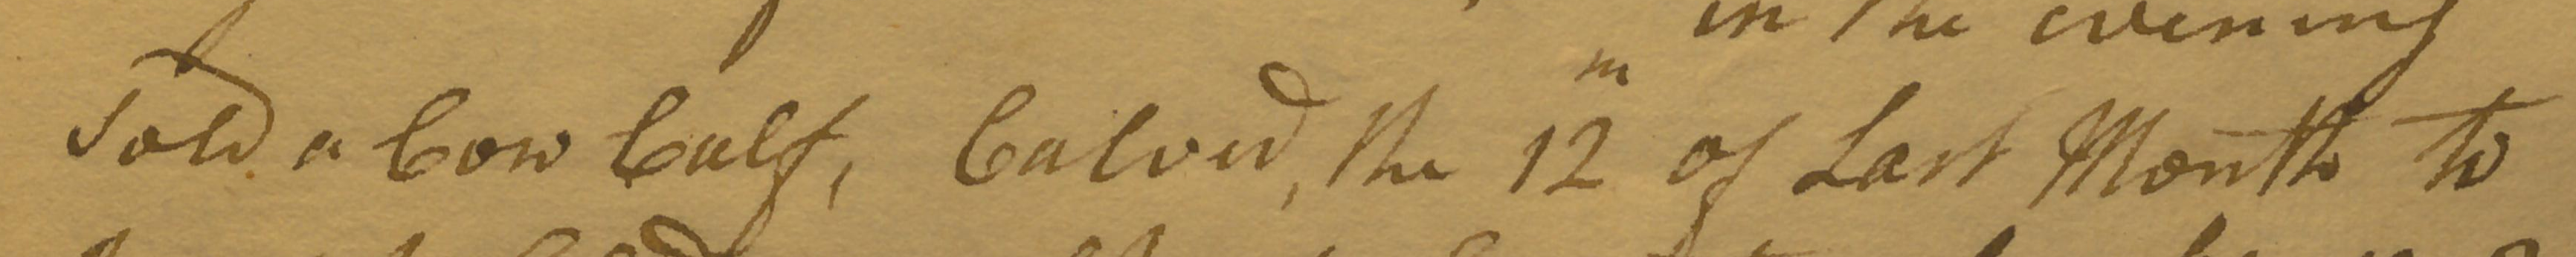sold a Cow Calf, Calved the 12^th of Last Month to
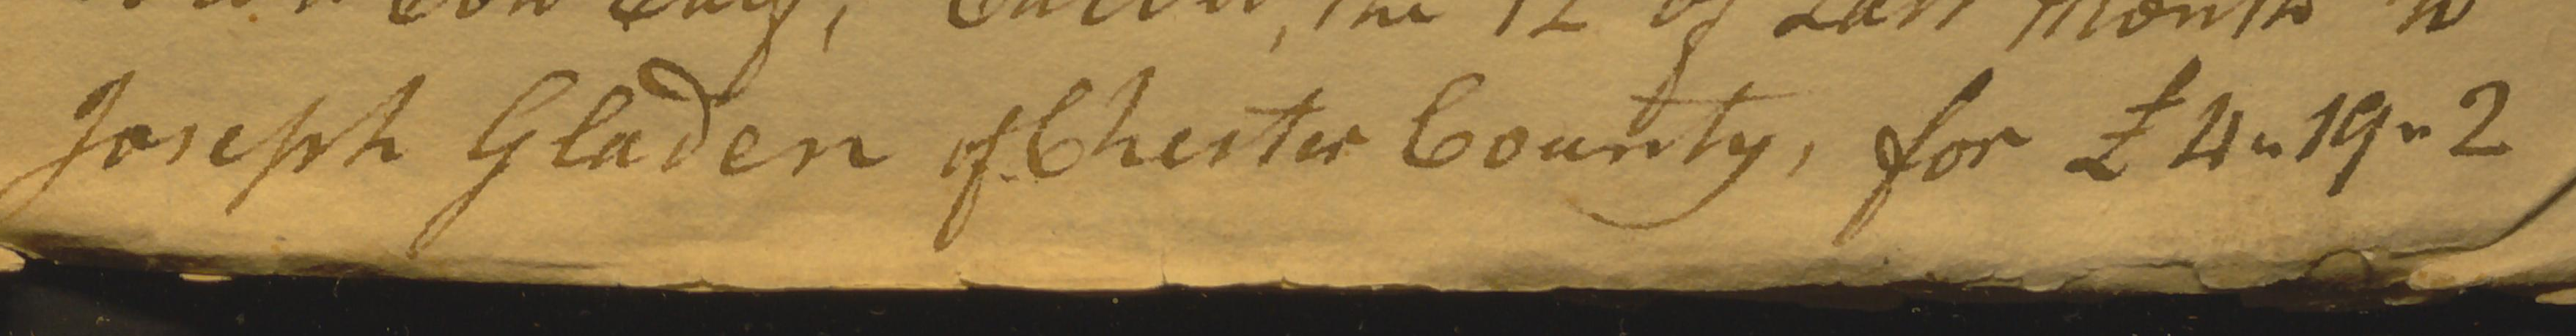Joseph Gladen of Chester County, for £4..19..2
